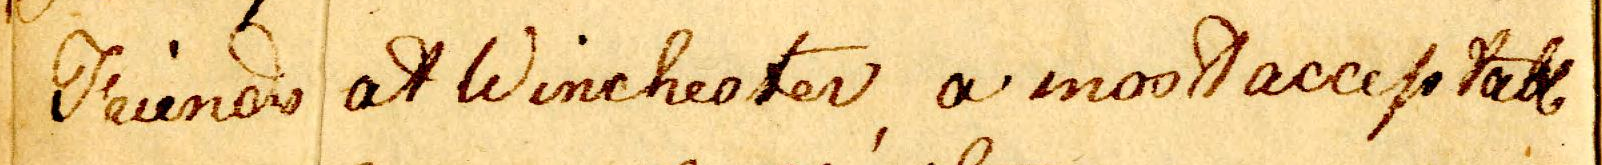Friends at Winchester a most acceptable
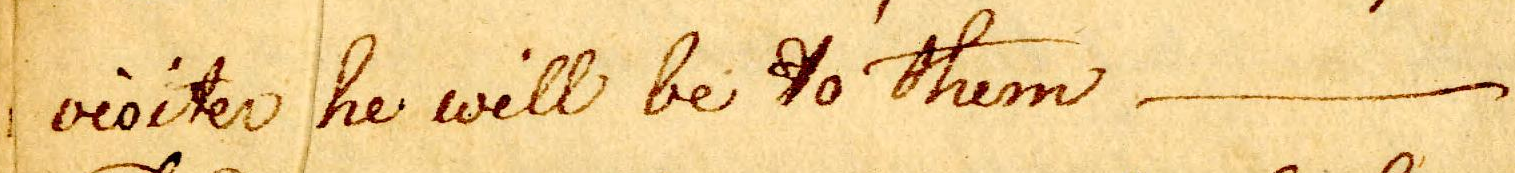visiter he will be to them-
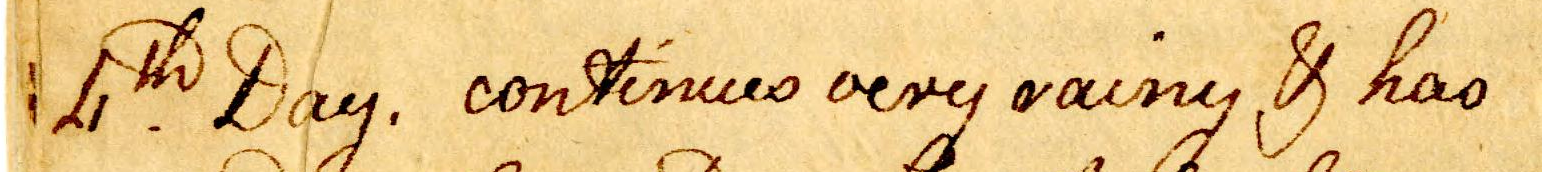4^th Day. continues very rainy & has
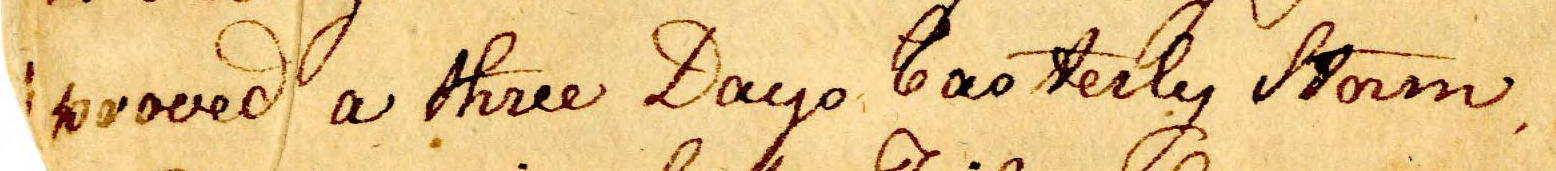proved a three Days Easterly Storm,
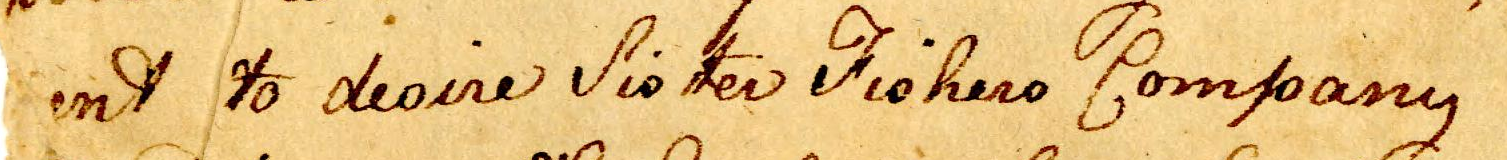ent to desire Sister Fishers Company
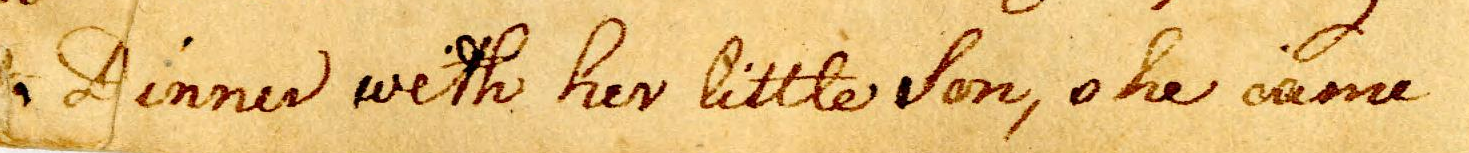Dinner with her little Son, she came
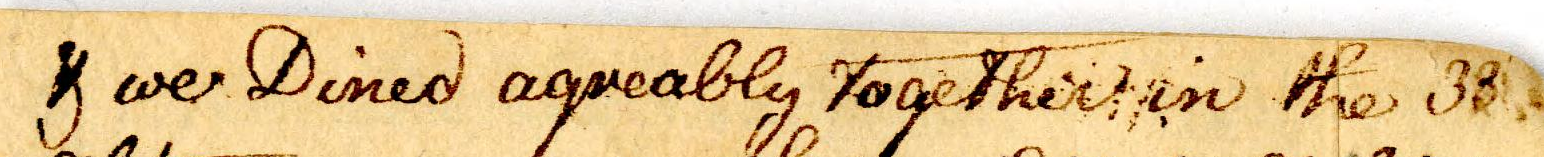& we Dined agreably together in the 33
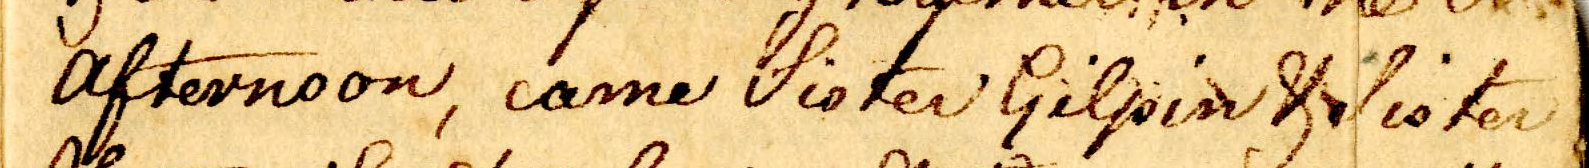Afternoon, came Sister Gilpin & of Sister
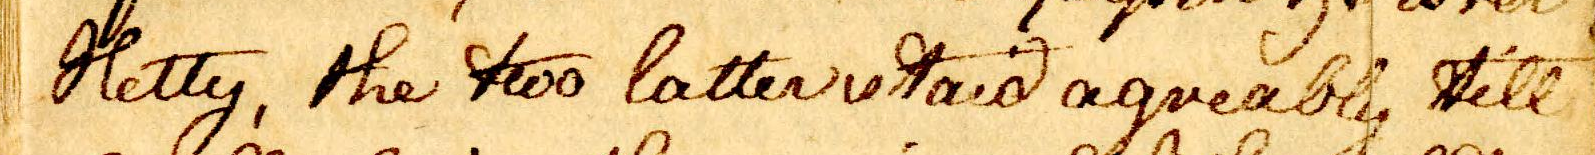Hetty, the two latter staid agreably till
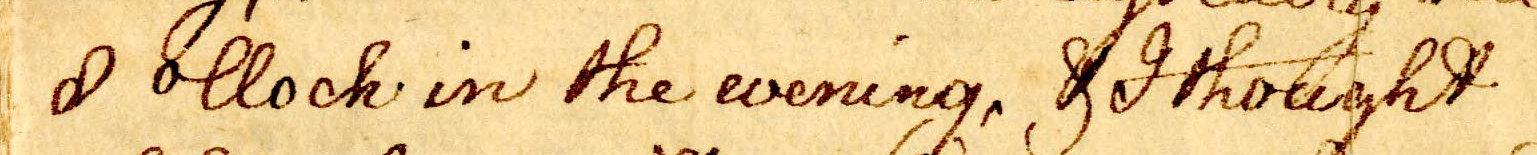8 ^o Clock in the evening, & I thought
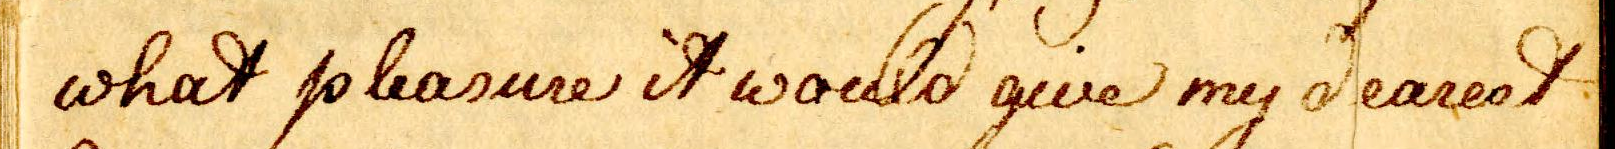what pleasure it would give my dearest
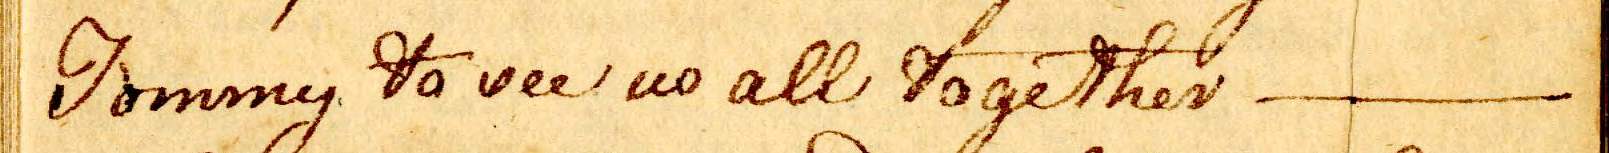Tommy to see us all together-
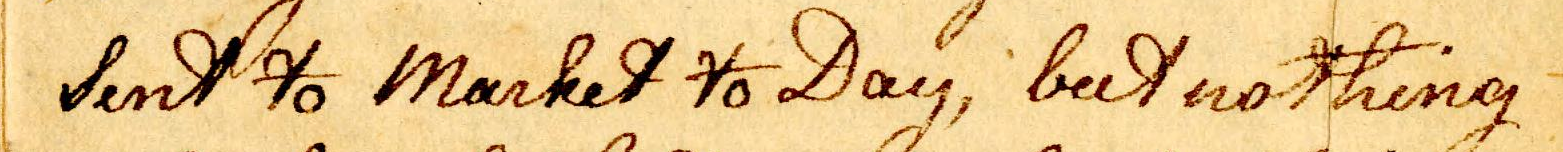Sent to Market to Day, but nothing
